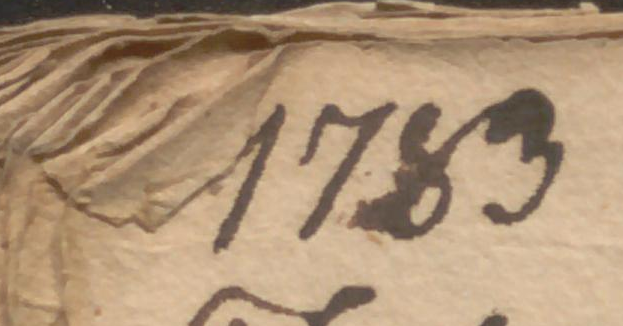1783
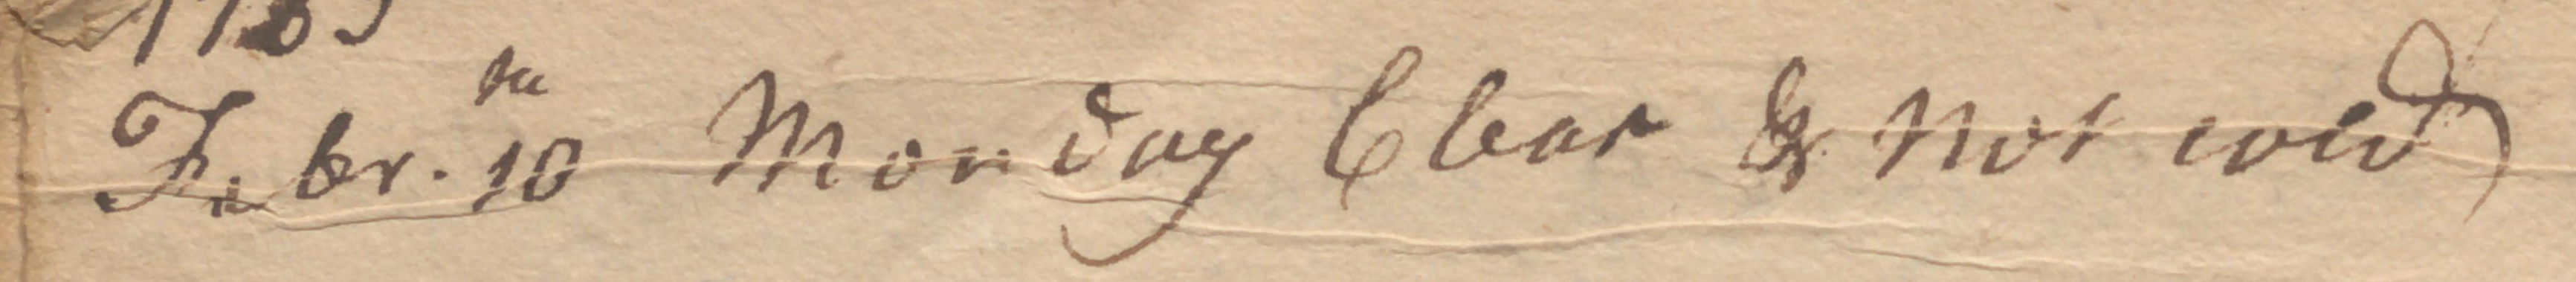Febr. 10^th Monday Clear & not cold
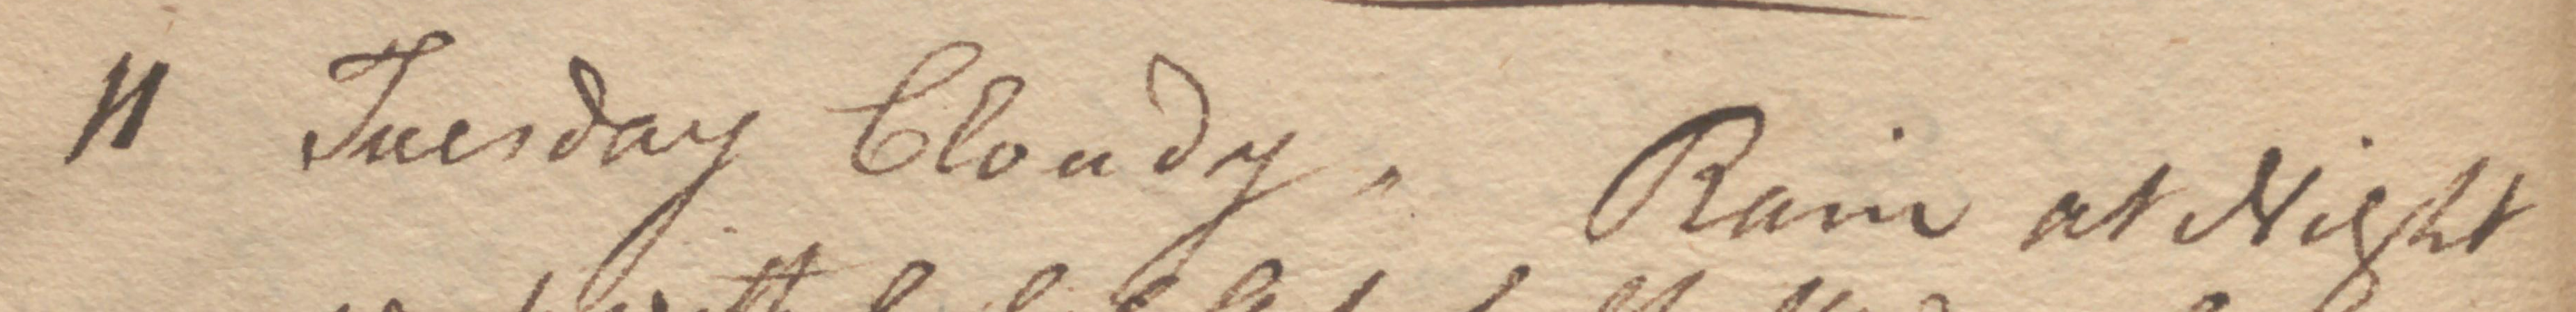11 Tuesday Cloudy. Rain at Night
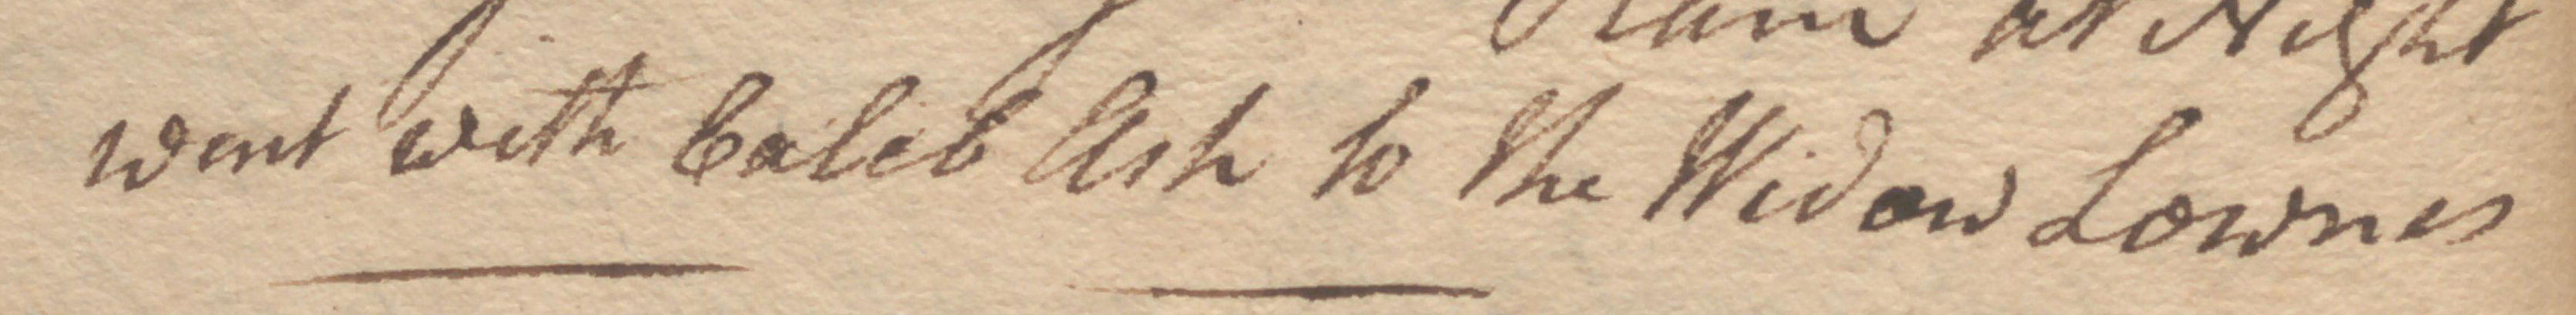went with Caleb Ash to the Widow Lownes
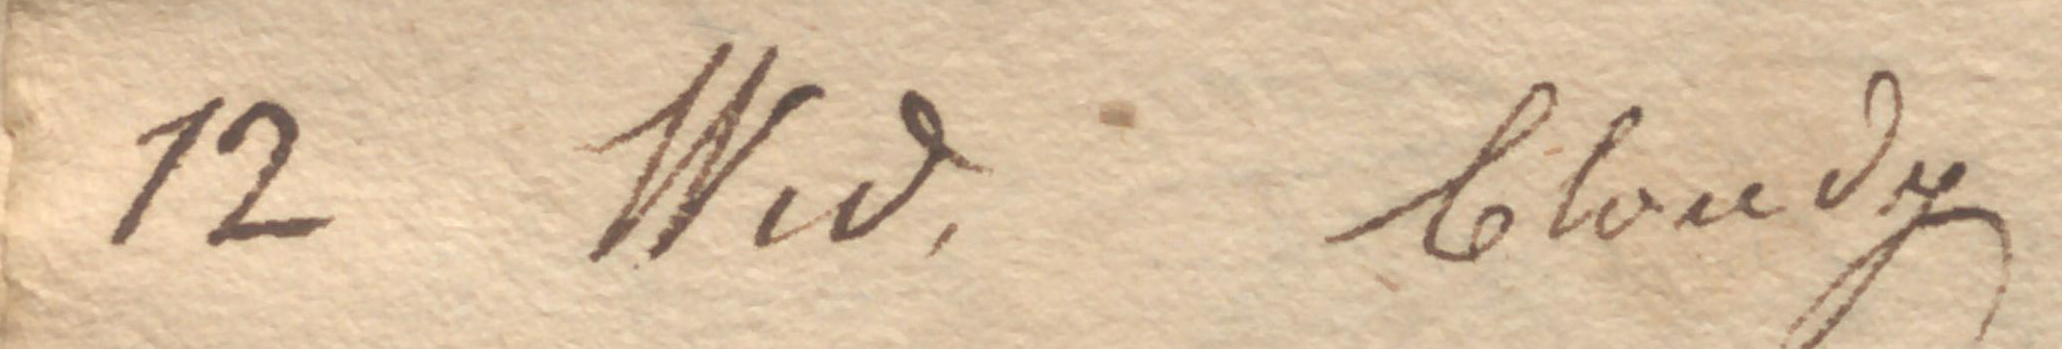12 Wed. Cloudy
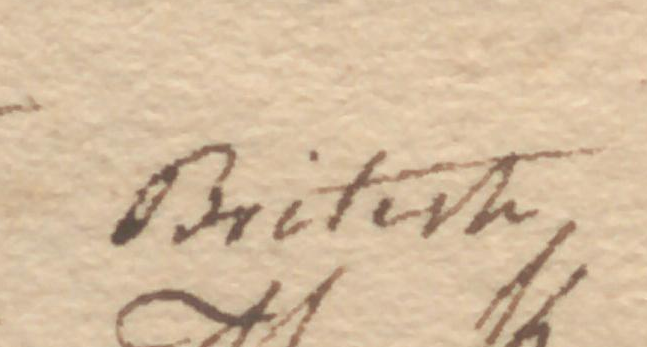British
